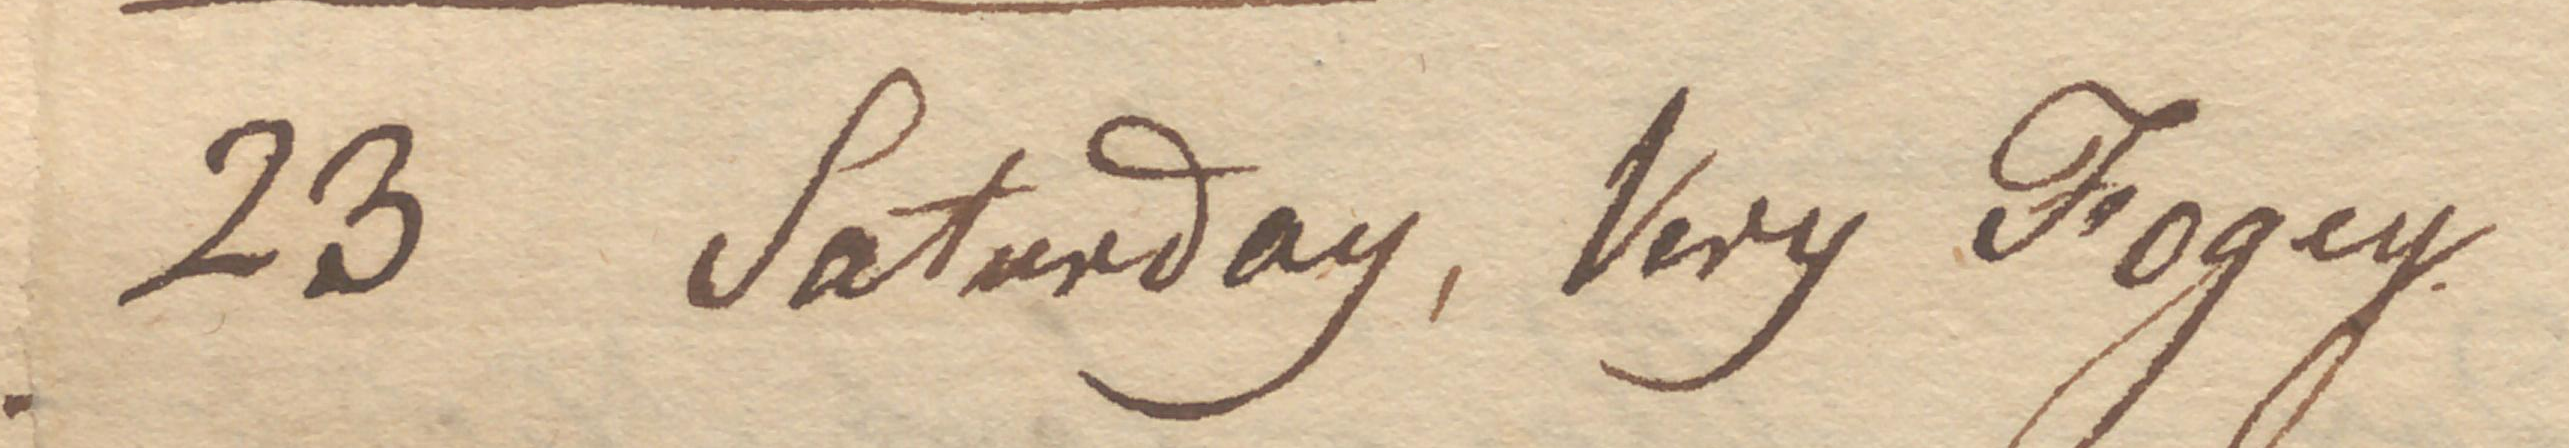28 Saturday, Very Fogey
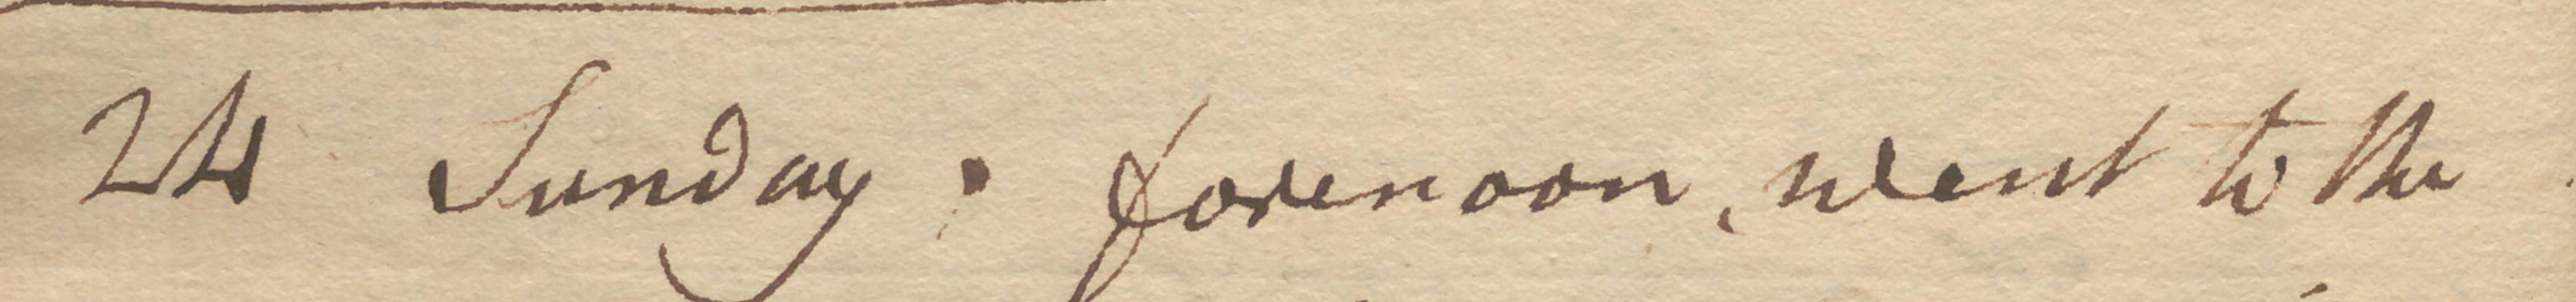24 Sunday: forenoon, went to the
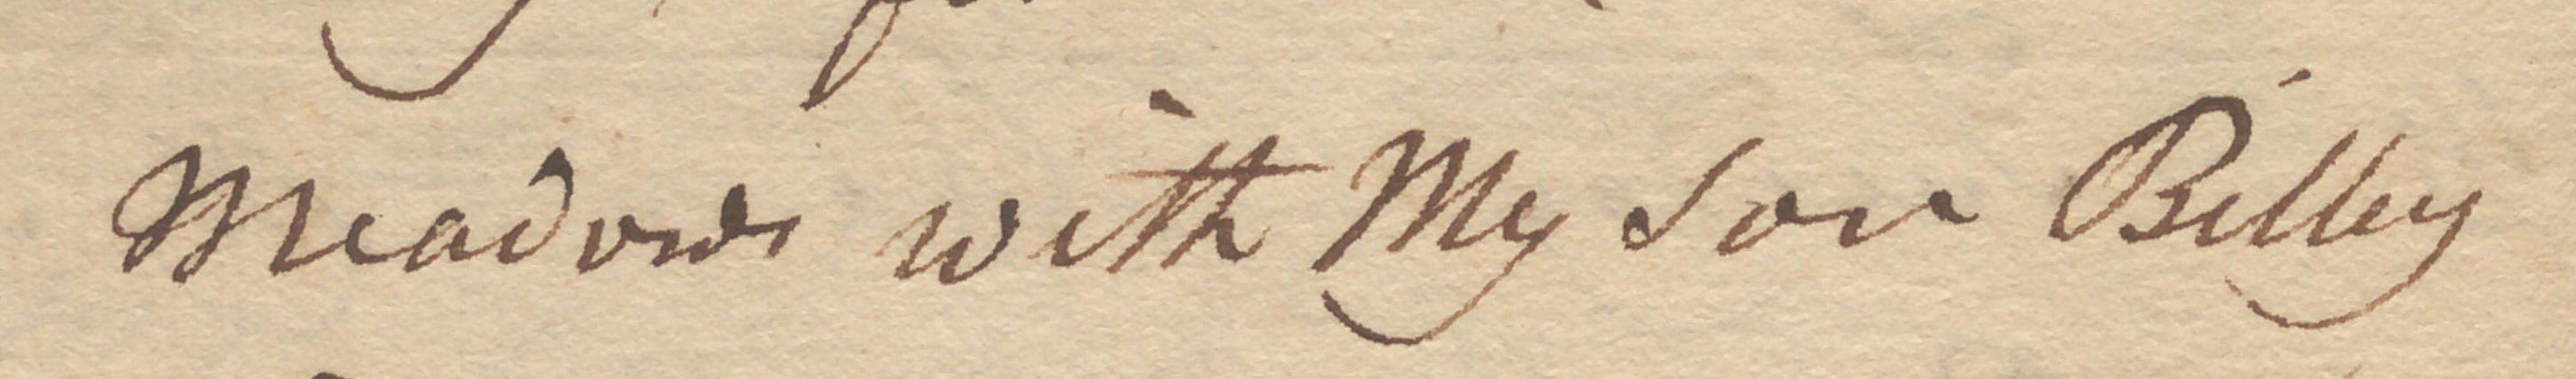Meadows with My son Billey
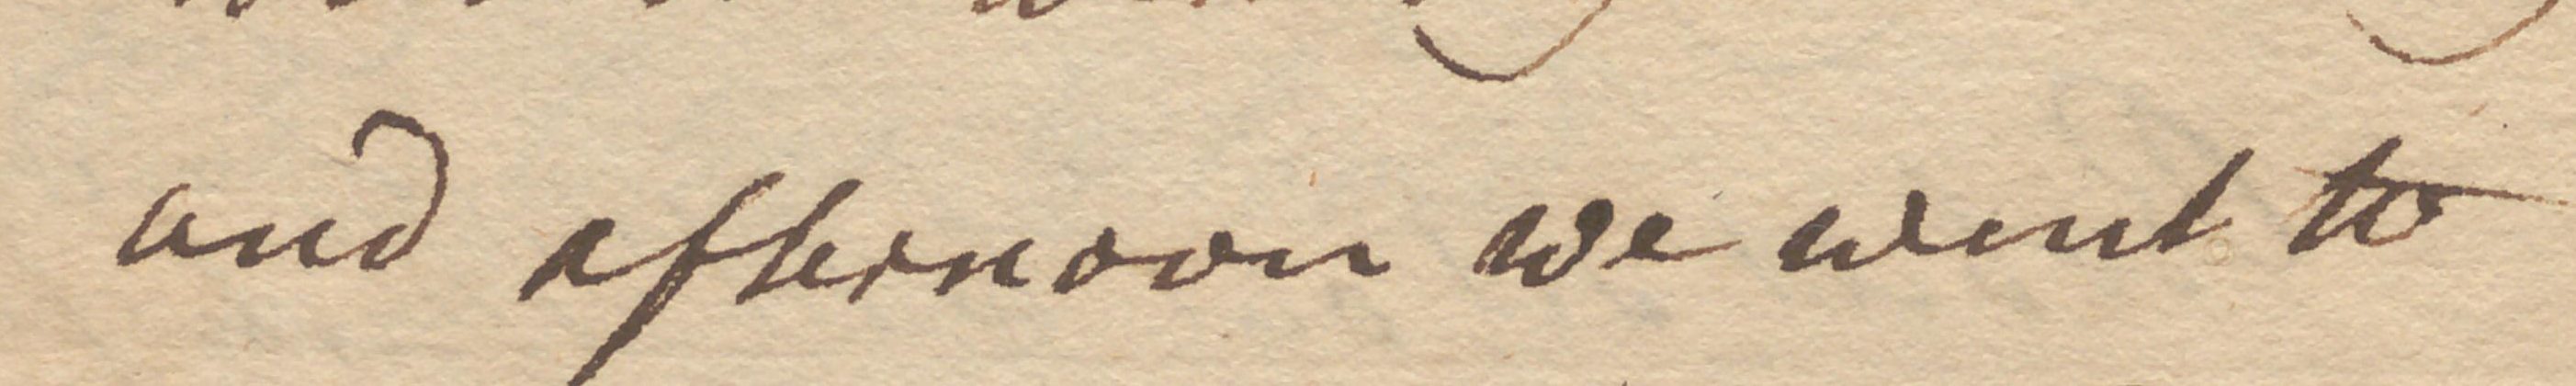and afternoon we went to
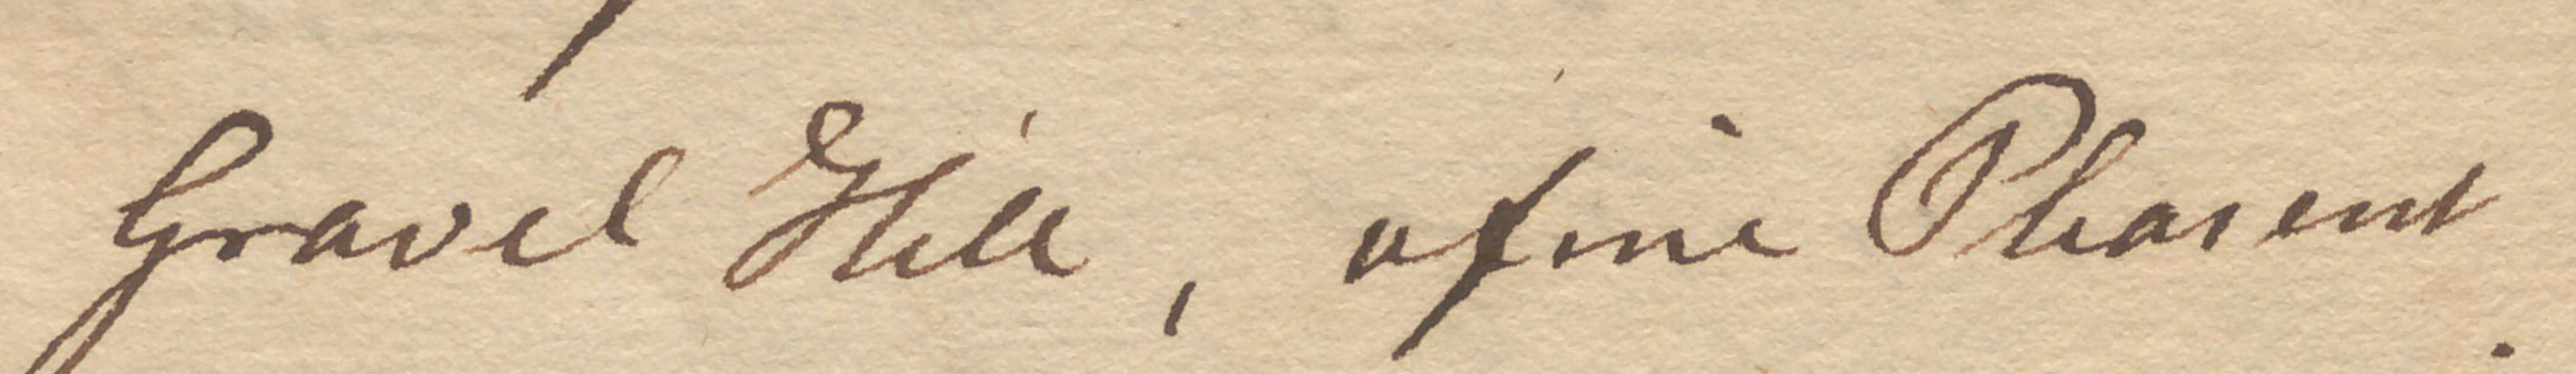Gravel Hill, a fine Pleasent
